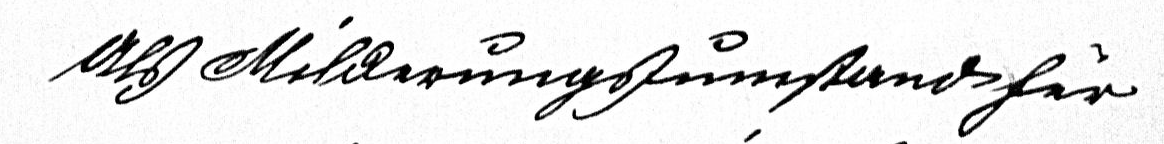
Als Milderungsumstand für
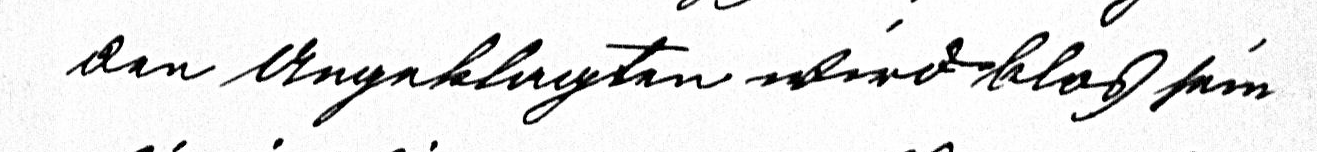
den Angeklagten wird blos sein
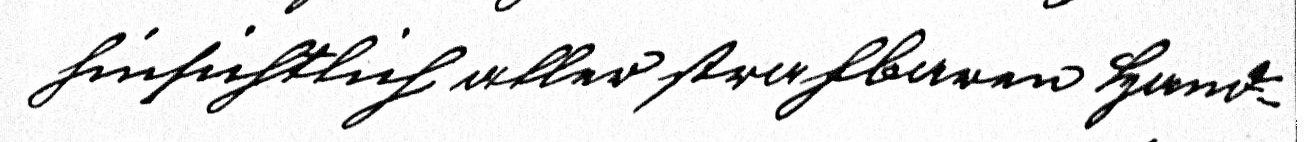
hinsichtlich aller strafbaren Hand¬
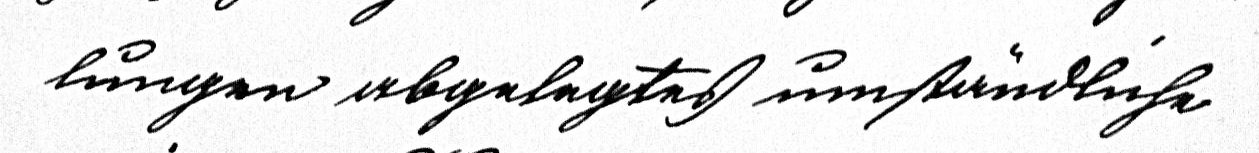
lungen abgelegtes umständliche
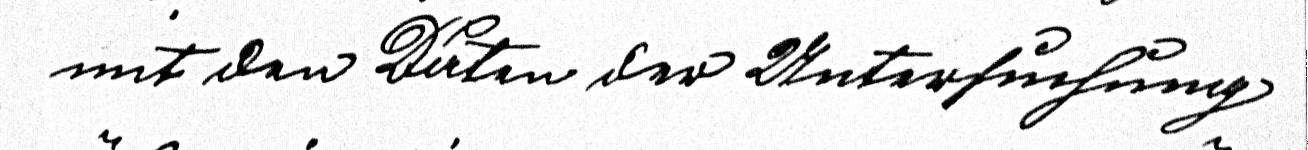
mit den Daten der Untersuchung
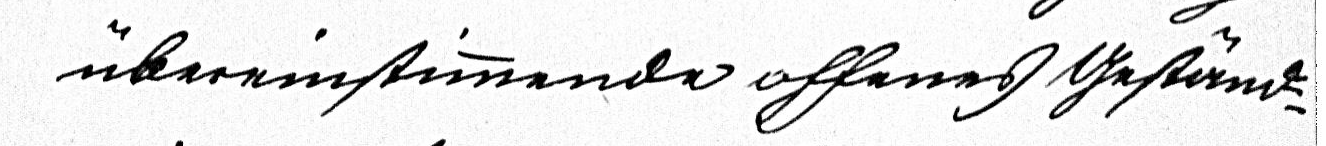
übereinstimmende offenes Geständ¬
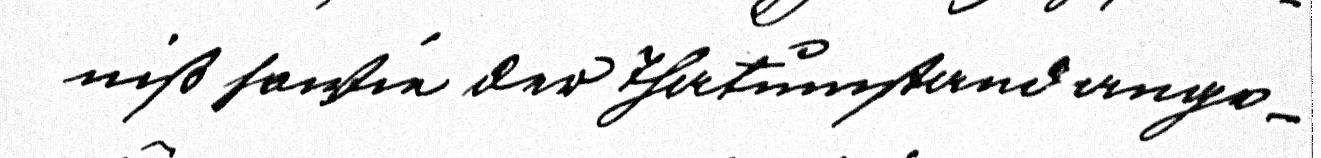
niß sowie der Thatumstand ange¬
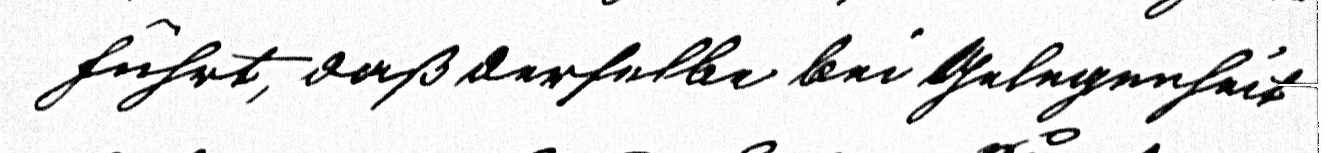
führt, daß derselbe bei Gelegenheit
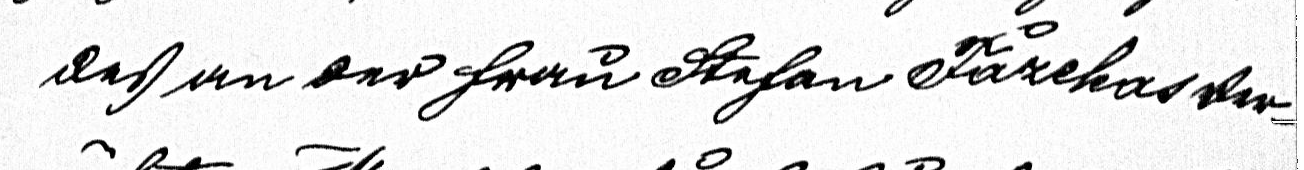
des an der Frau Stefan Fazehas ver¬
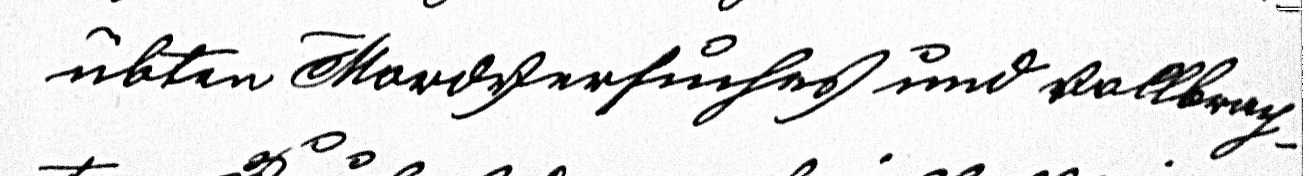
übten Mordversuches und vollbrach¬
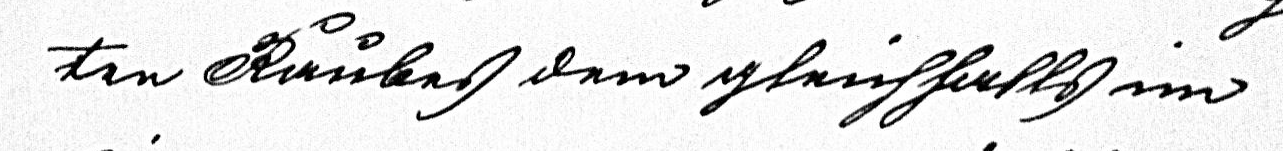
ten Raubes dem gleichhalls im
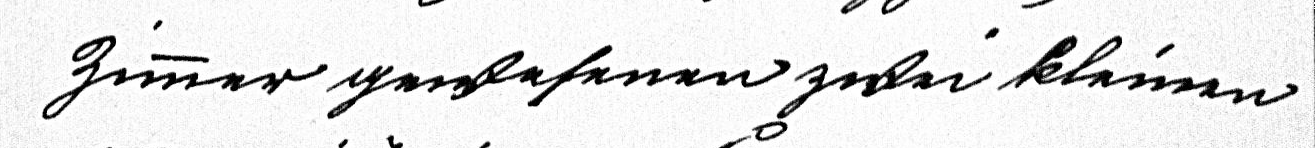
Zimmer gewesenen zwei kleinen
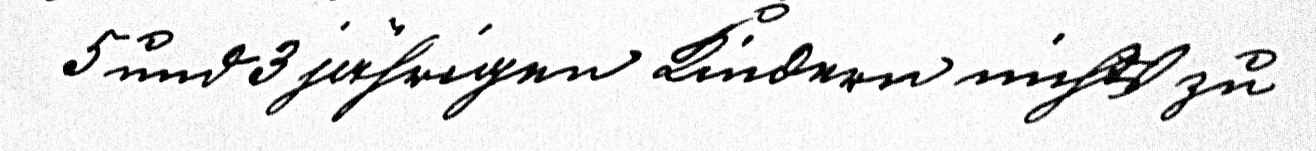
5 und 3 jährigen Kindern nicht zu
